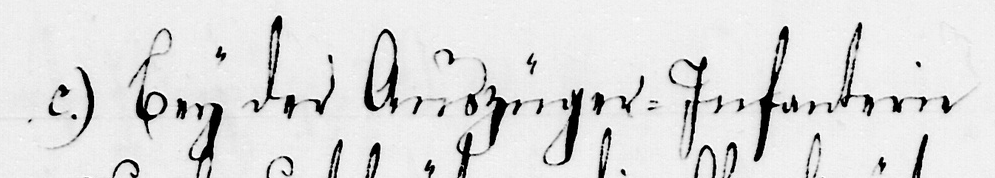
c.) Bey der Auszüger-Infanterie
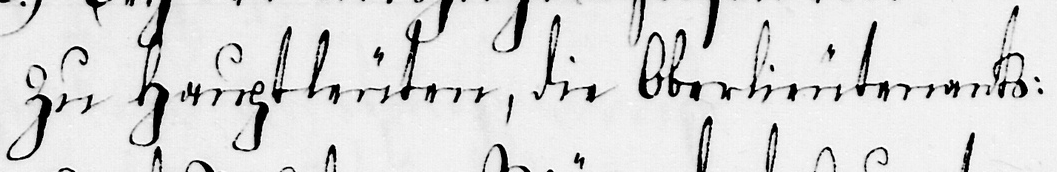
Zu Hauptleuten, die Oberlieutenants:
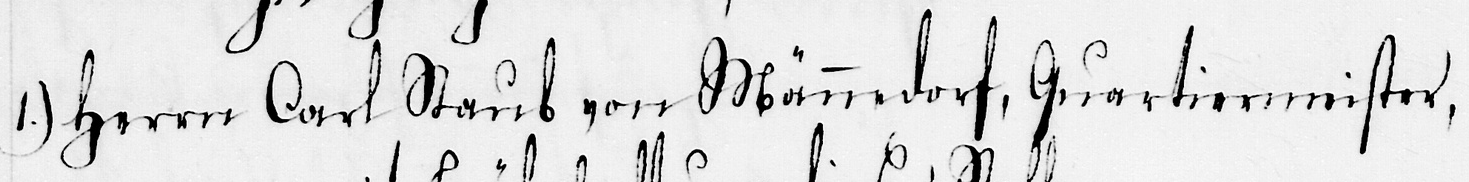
1.) Herrn Carl Staub von Männedorf, Quartiermeister,
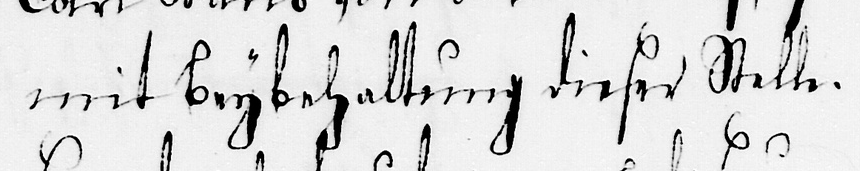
mit Beybehaltung dieser Stell¬
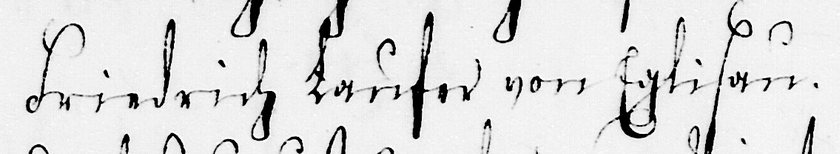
Friedrich Laufer von Eglisau.
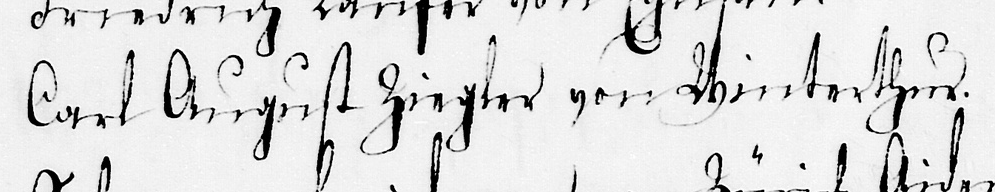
Carl August Ziegler von Winterthur.
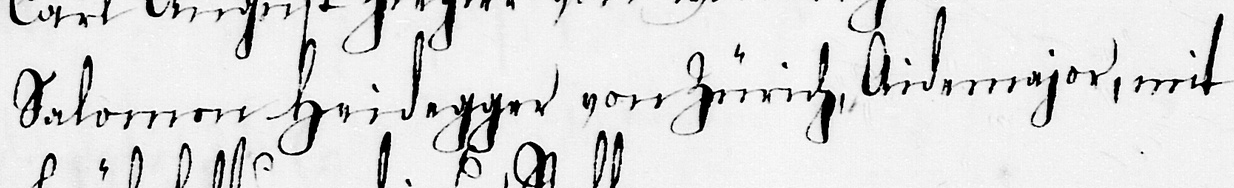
Salomon Heidegger von Zürich, Aidemajor, mit
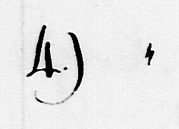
4.)
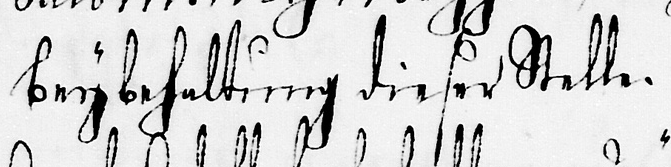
Beybehaltung dieser Stell¬
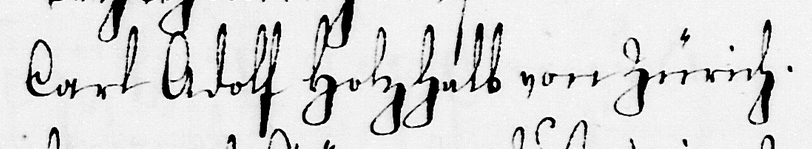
Carl Adolf Holzhalb von Zürich.
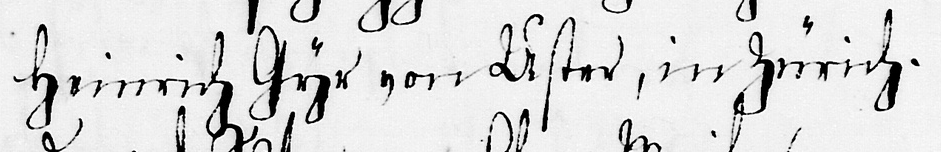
Heinrich Gyr von Uster, in Zürich.
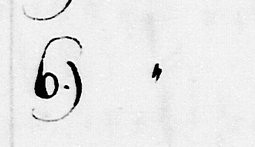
6.) “
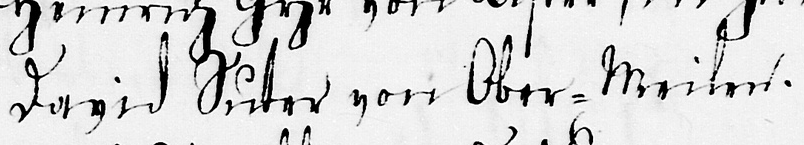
David Suter von Ober-Meilen.
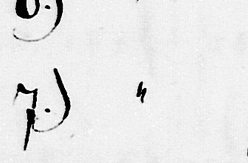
8.)
